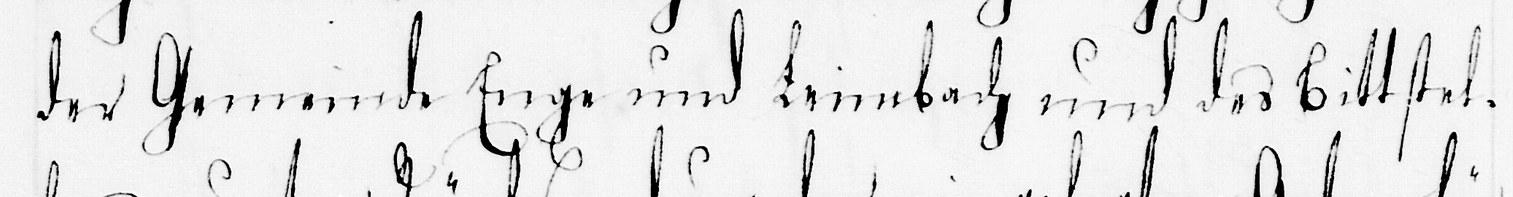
der Gemeinde Enge und Leimbach und des Bittstel¬
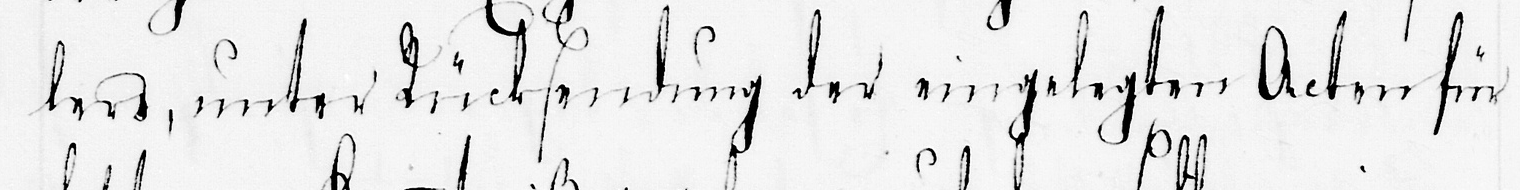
lers, unter Rücksendung der eingelegten Acten für
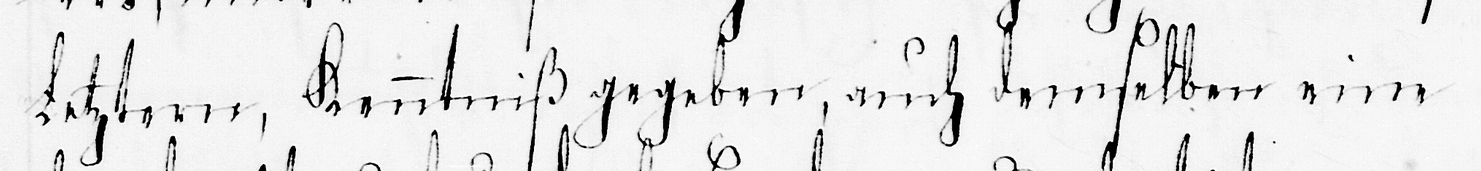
Letztern, Kenntniß gegeben, auch demselben eine
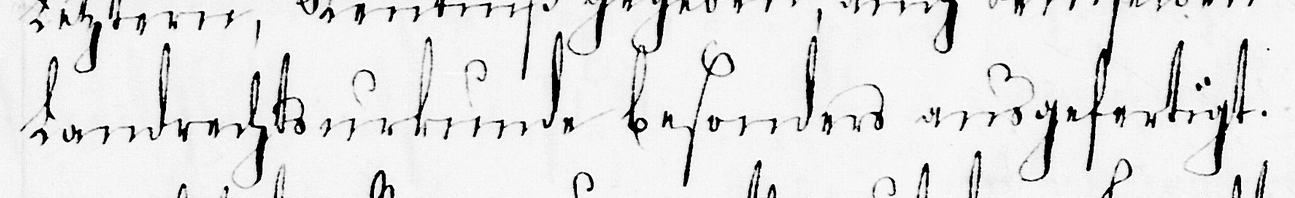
Landrechtsurkunde besonders ausgefertigt.
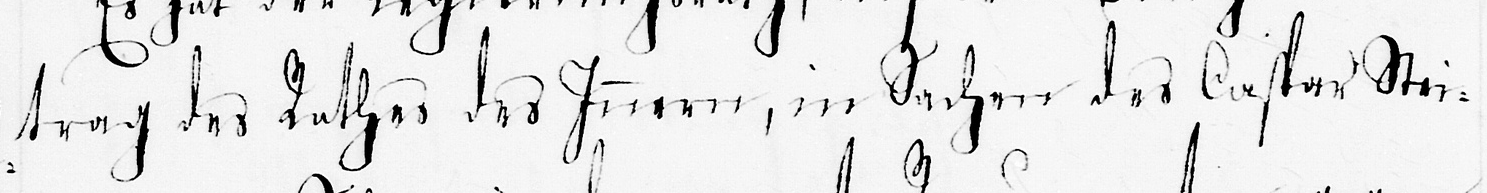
trag des Rathes des Innern, in Sachen des Caspar Stei¬
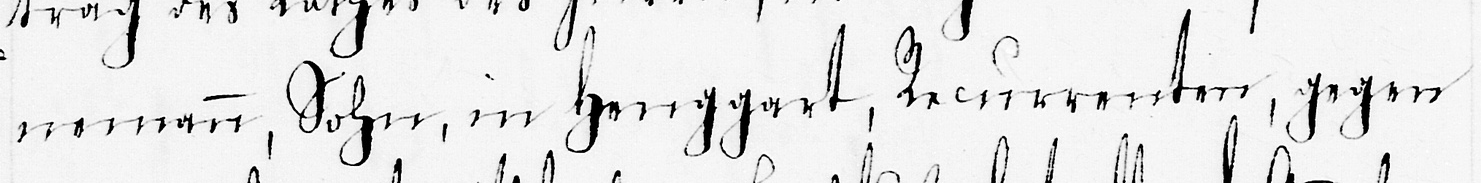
nemann, Sohn, in Henggart, Recurrenten, gegen
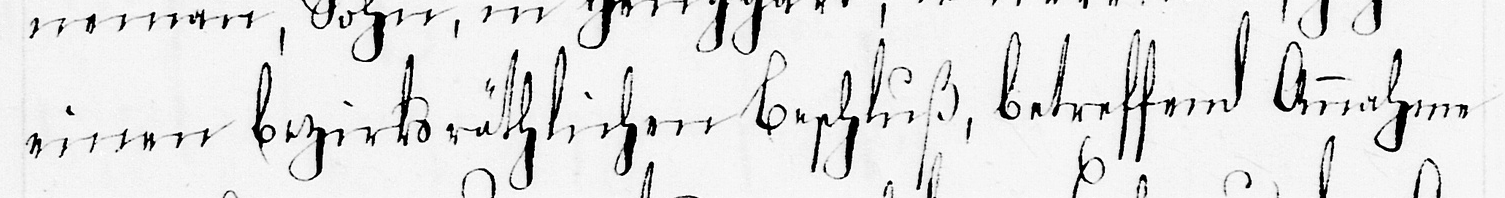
einen bezirksräthlichen Beschluß, betreffend Annahme
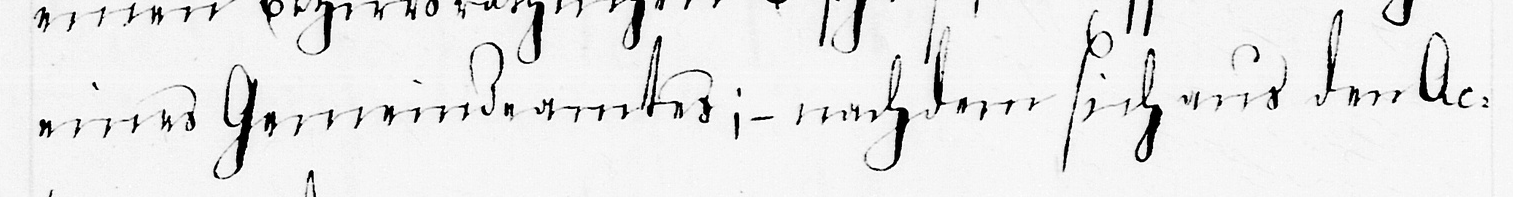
eines Gemeindeamtes; – nachdem sich aus den Ac¬
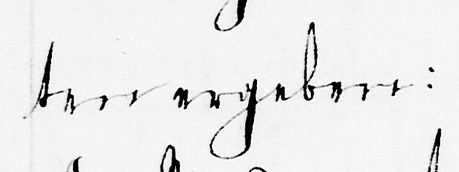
ten ergeben:
